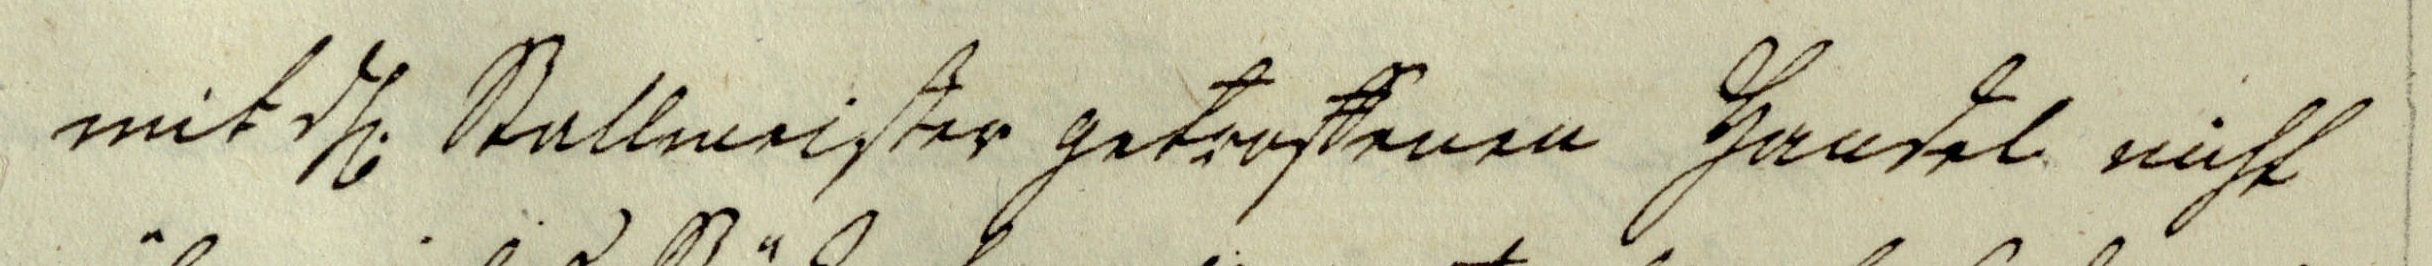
mit dh. Stallmister getroffenen Handel nicht
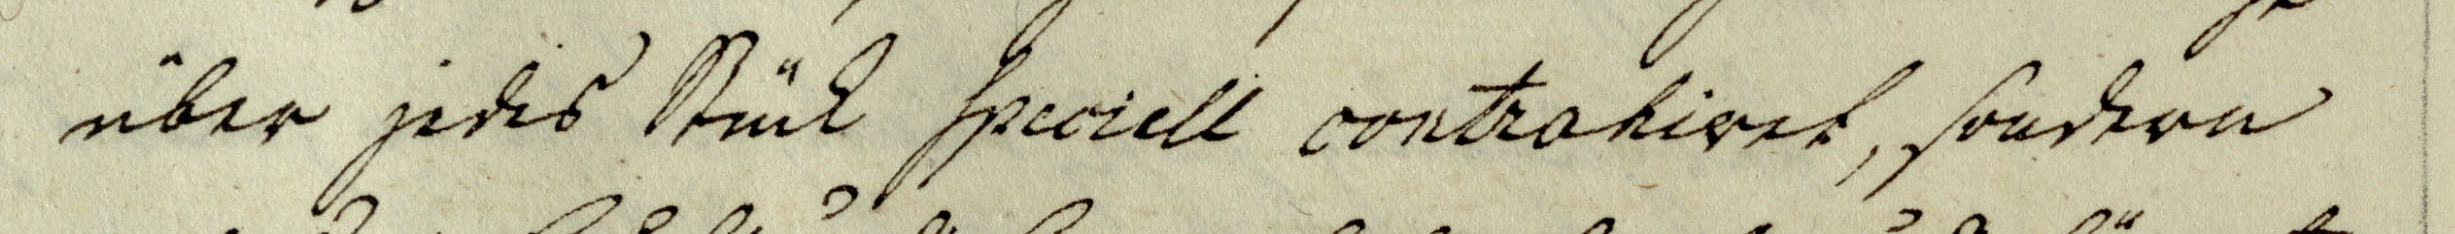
über jedes Stück speciell contrahiret, sondern
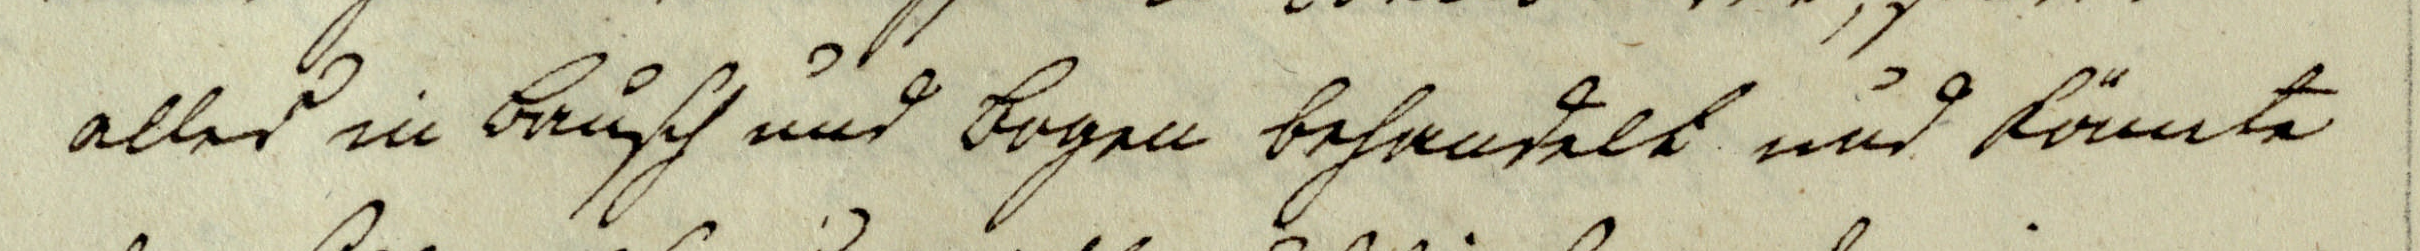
alles in Bausch und Bogen behandelt und könnte
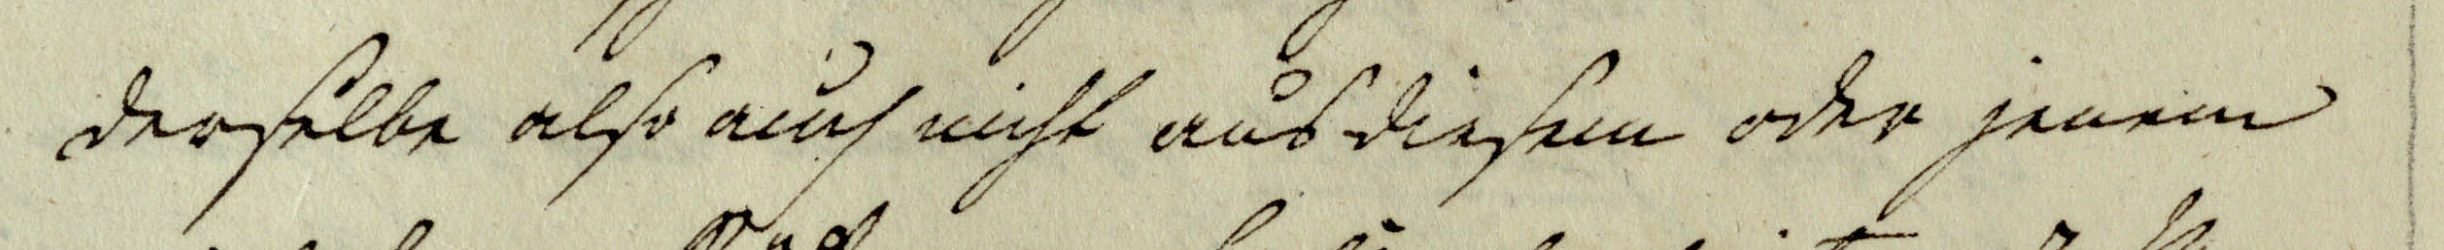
derselbe also auch nicht aus diesem oder jenem
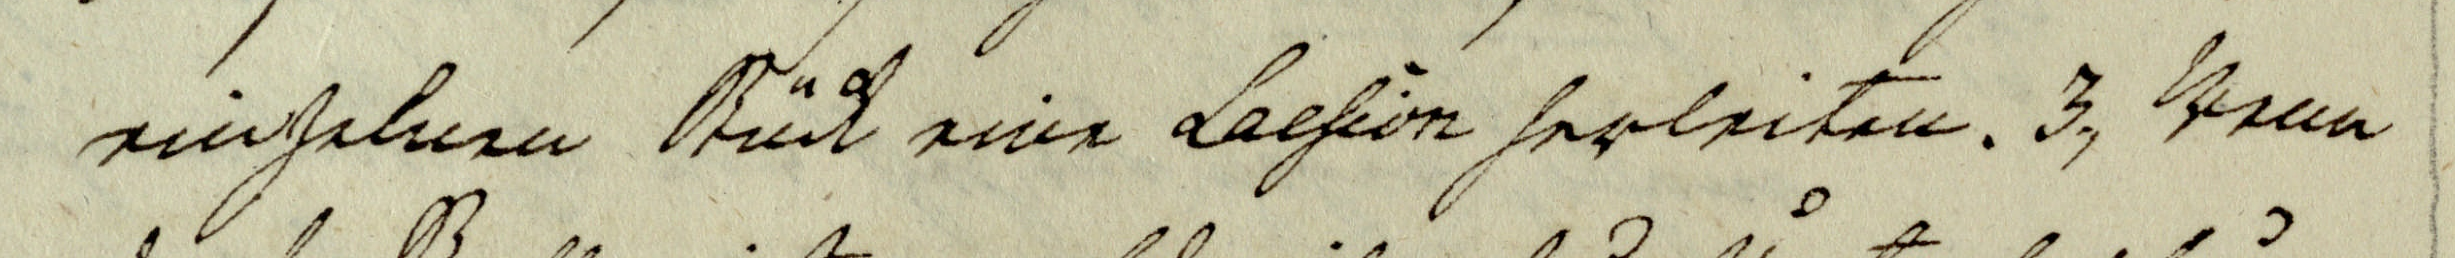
einzelnen Stand eine Laesion herleiten. 3., Wenn
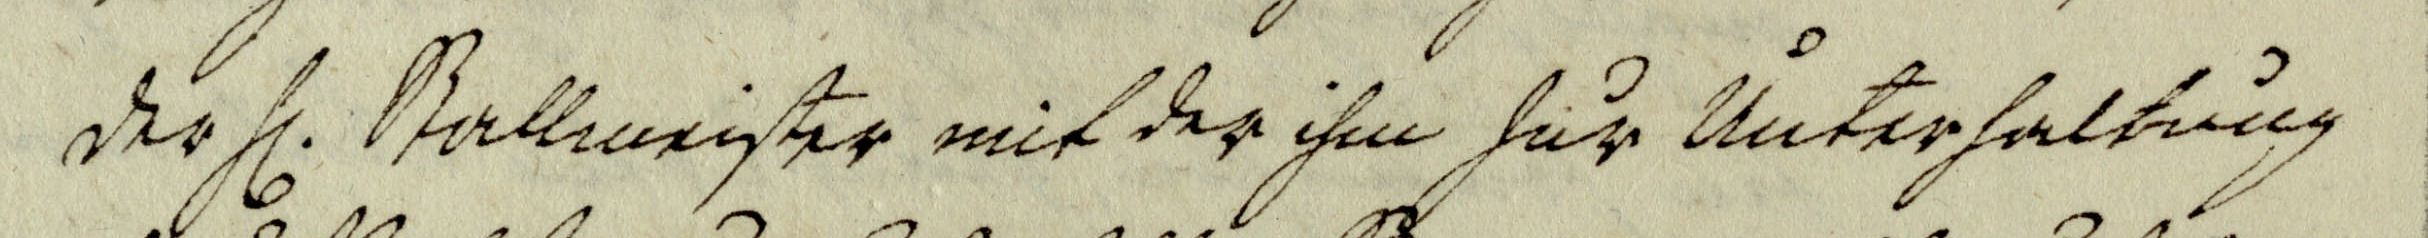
der h. Stallmeister mit der ihm zur Unterhaltung
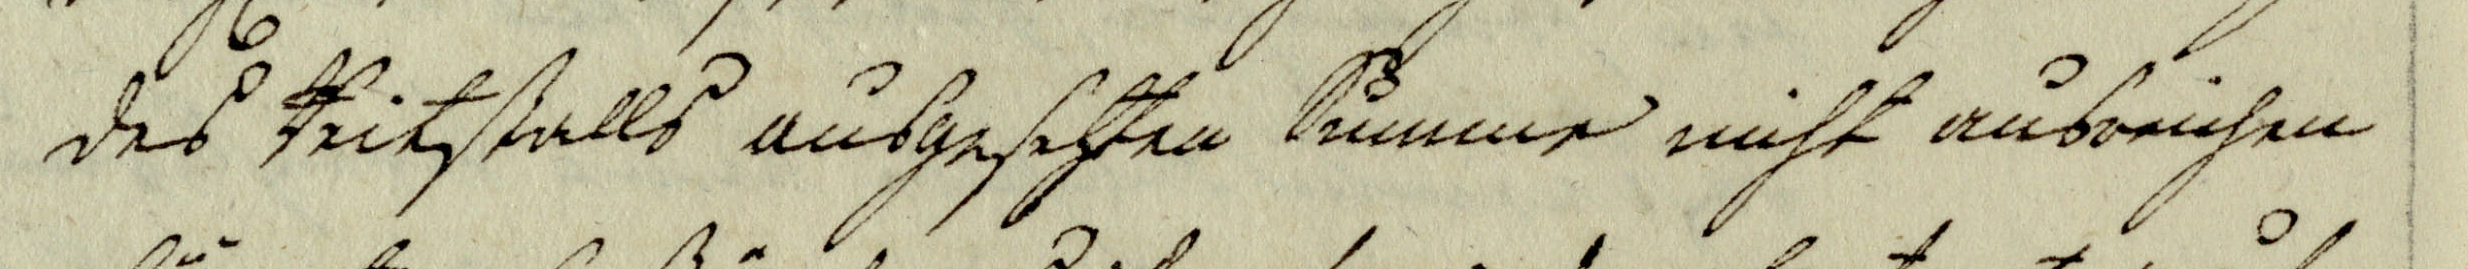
des Reittstalls ausgesetzten Summe nicht ausreichen
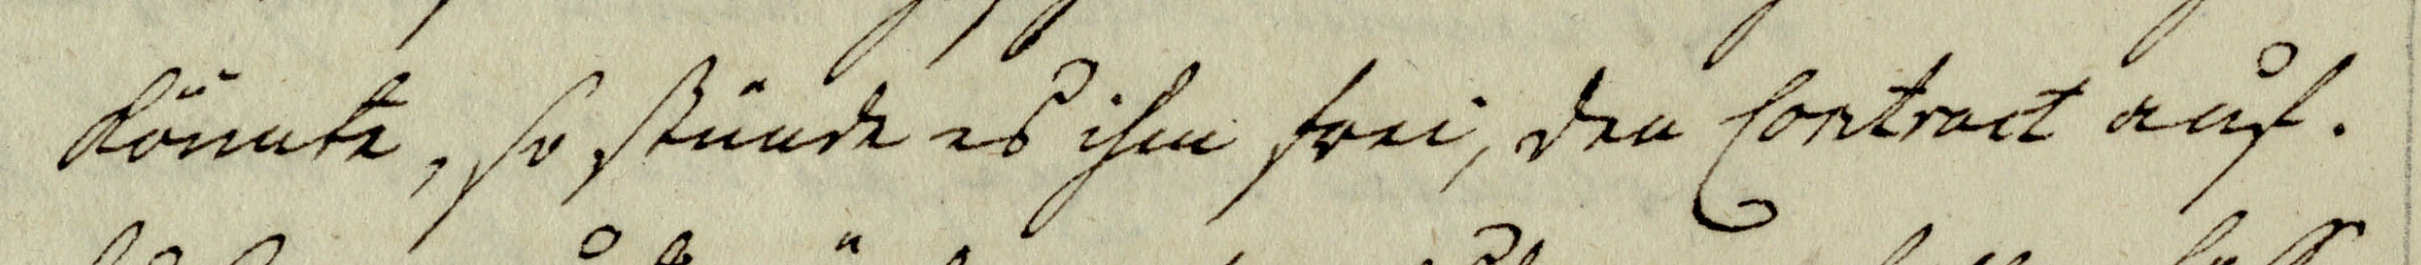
könnte, so stünde es ihm frei, den Contract auf¬
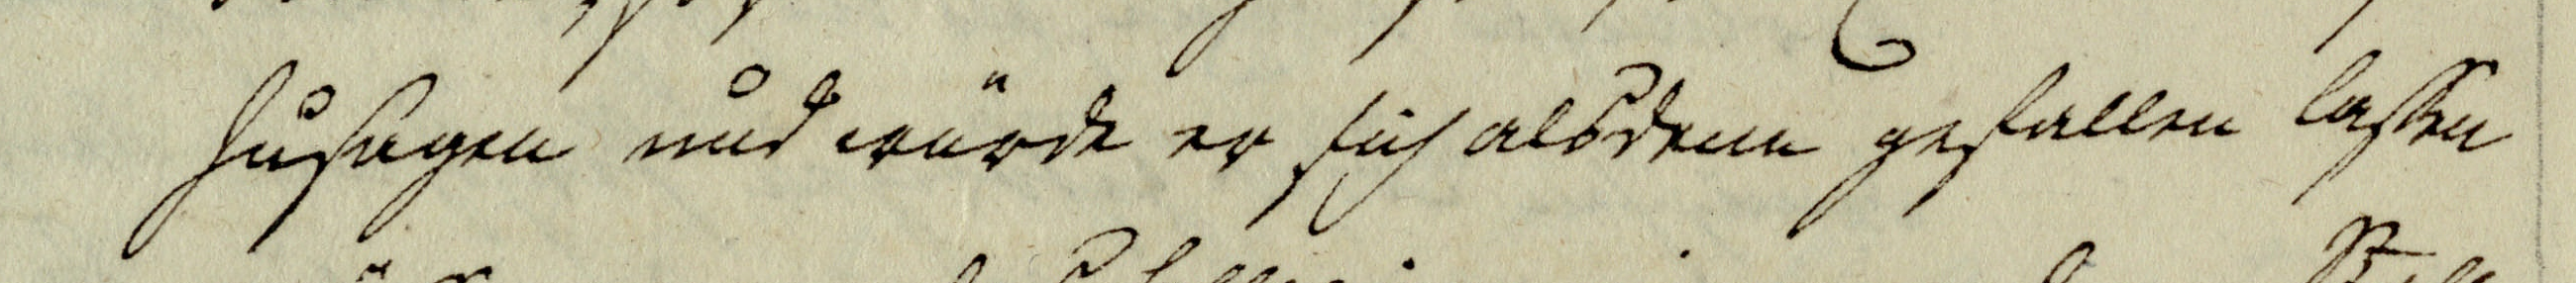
zusagen und würde er sich alsdenn gefallen lassen
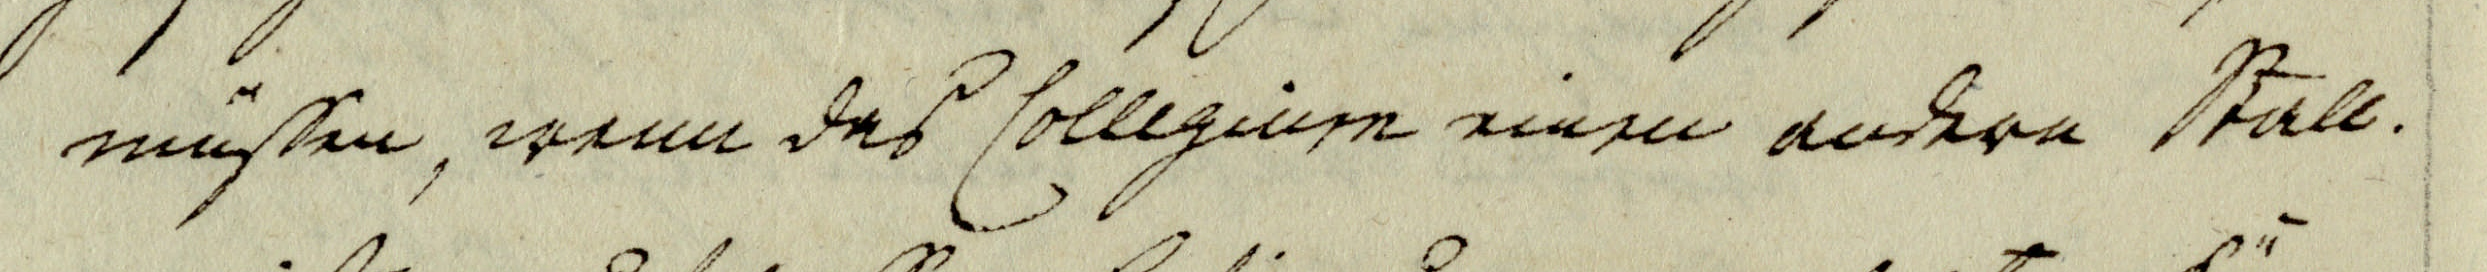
müssen, wenn das Collegium einen andern Stall¬
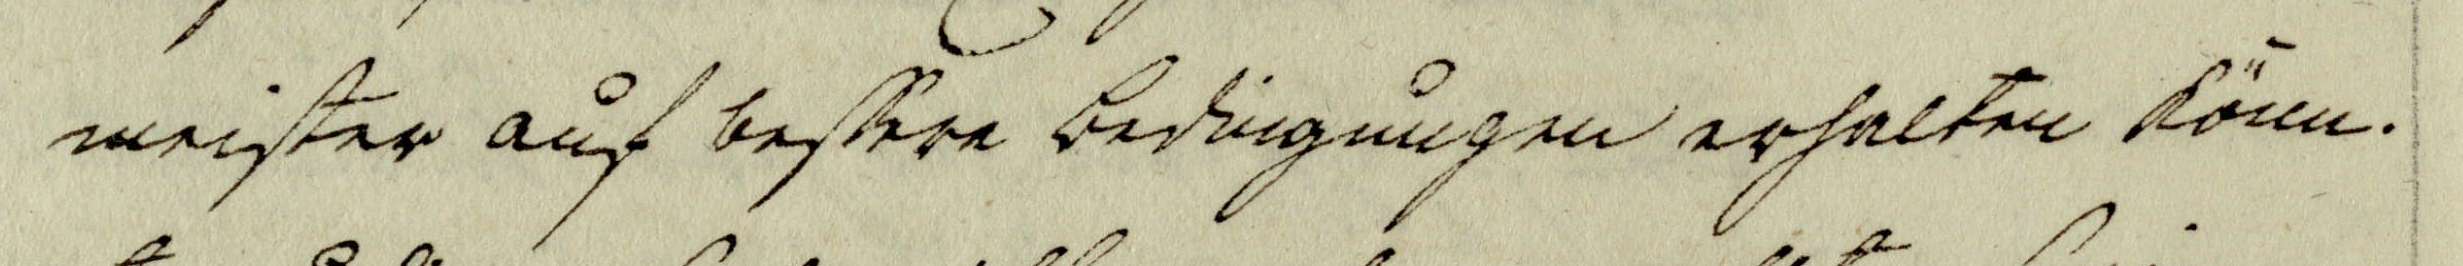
meister auf bessere Bedingungen erhalten könn¬
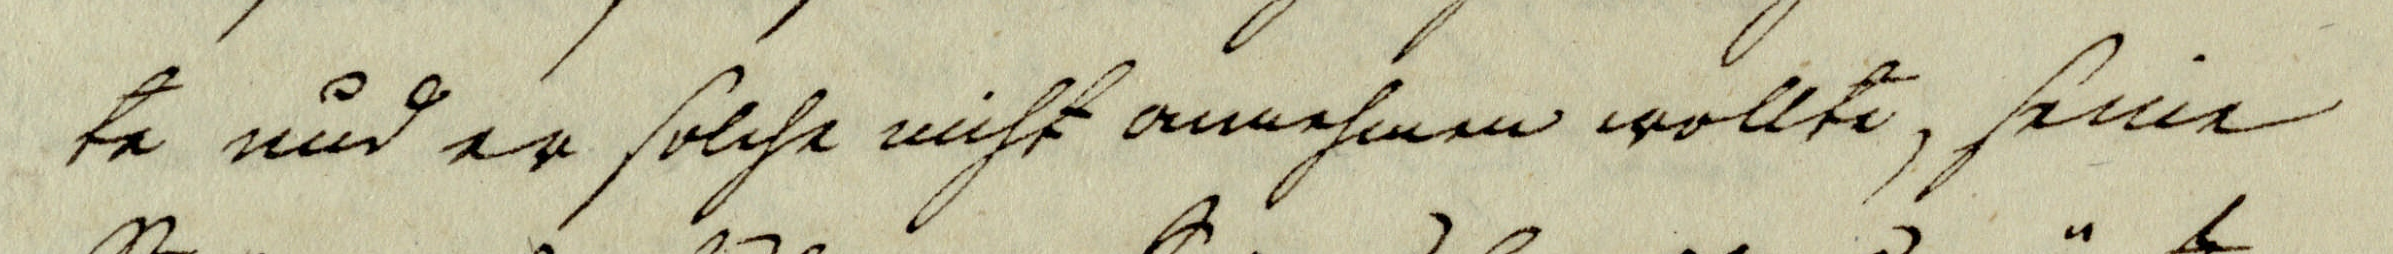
te und er solche nicht annehmen wollte, seine
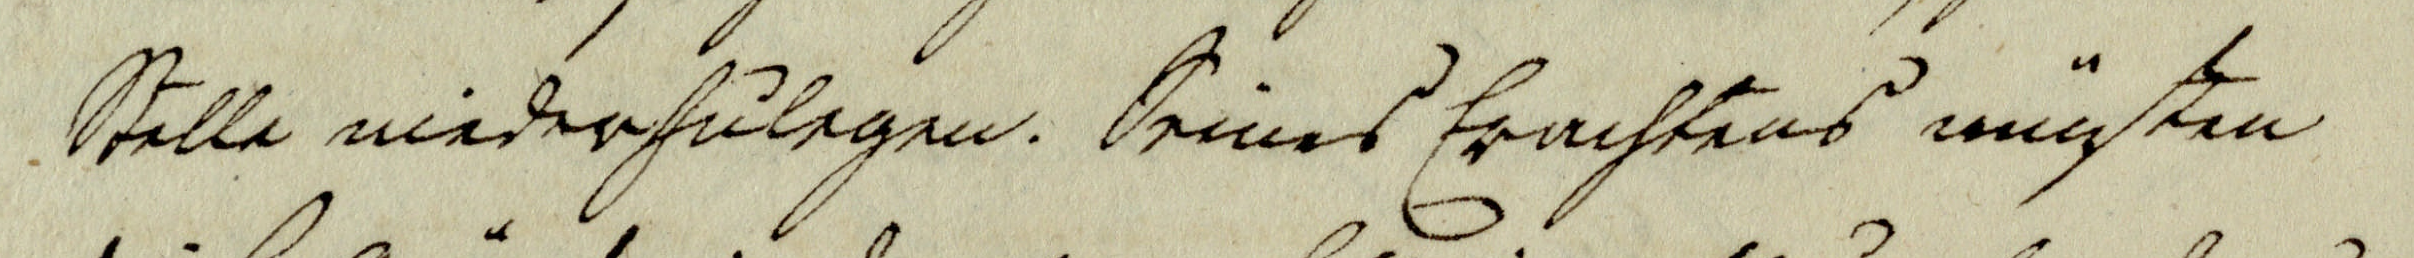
Stelle niederzulegen. Seines Erachtens müßten
